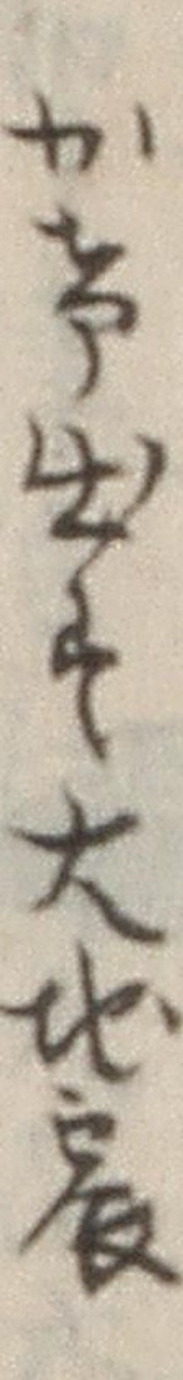かけ出す大地震
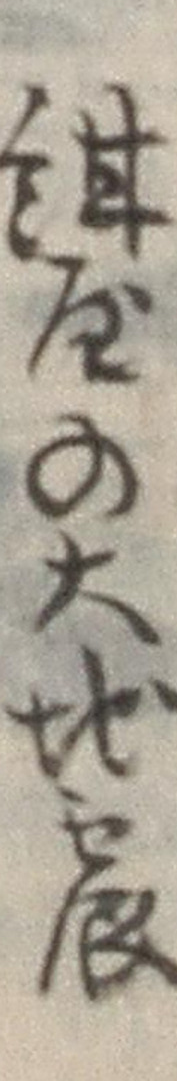紺屋の大地震
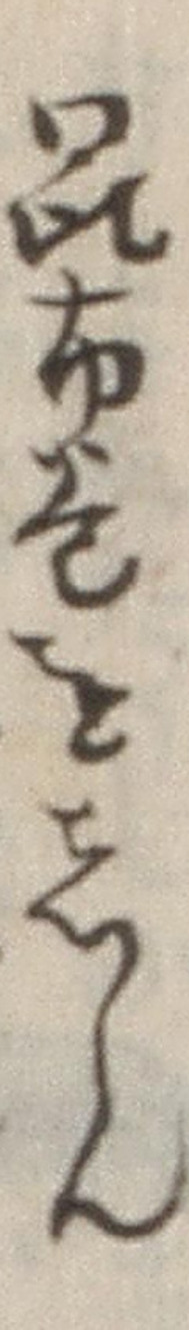昆布巻をししん
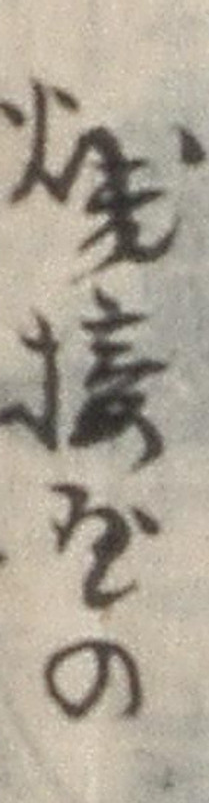焼接屋の
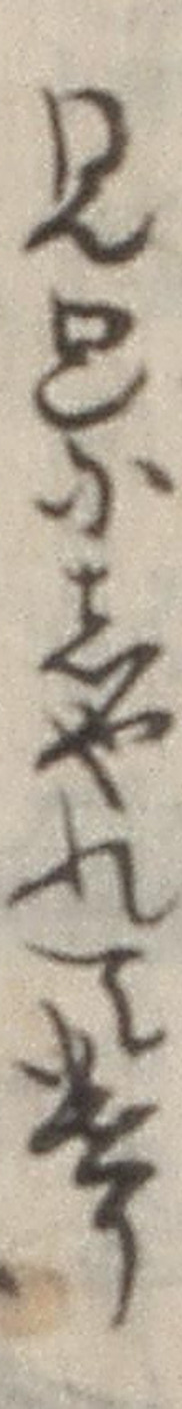見廻にしやれて遣り
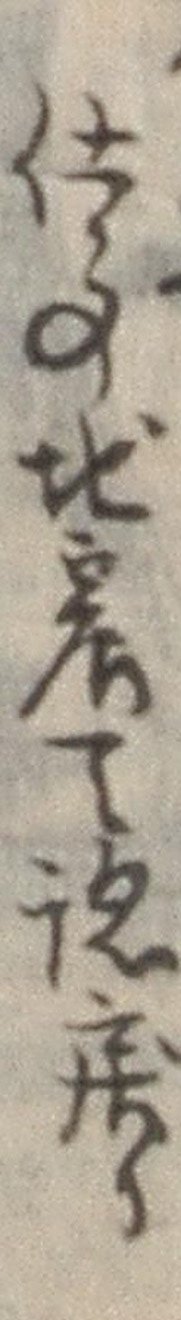仕事地震で跡戻り
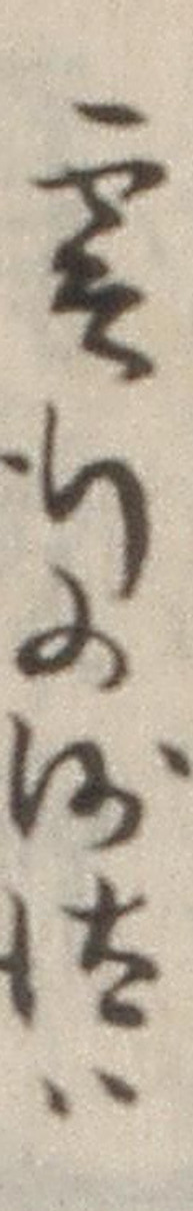雲行の沙汰は
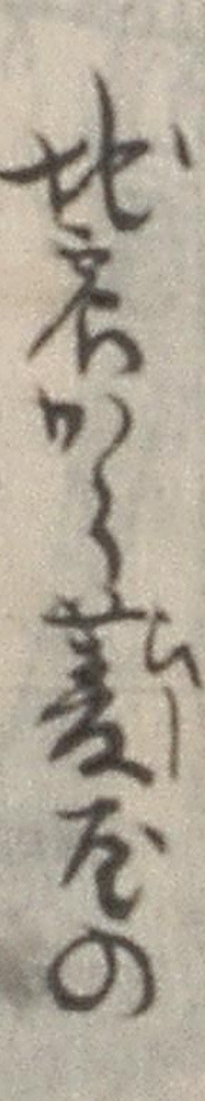地震から菱屋の
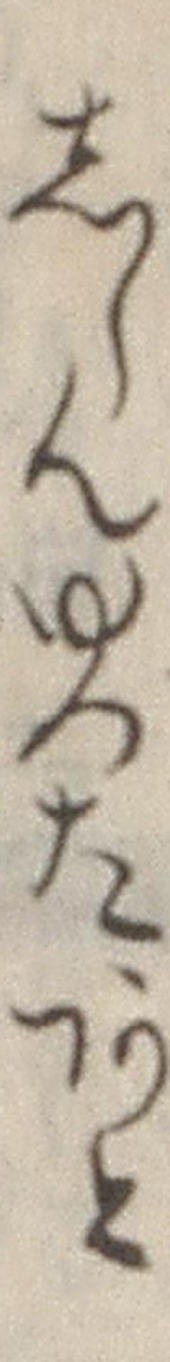ししんゆつたあと
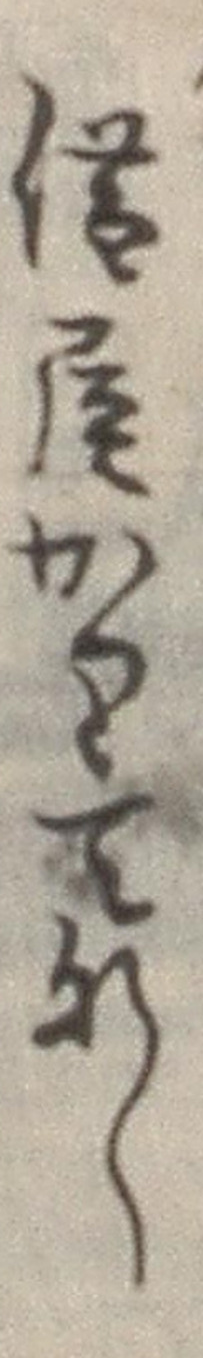借家かりてなし
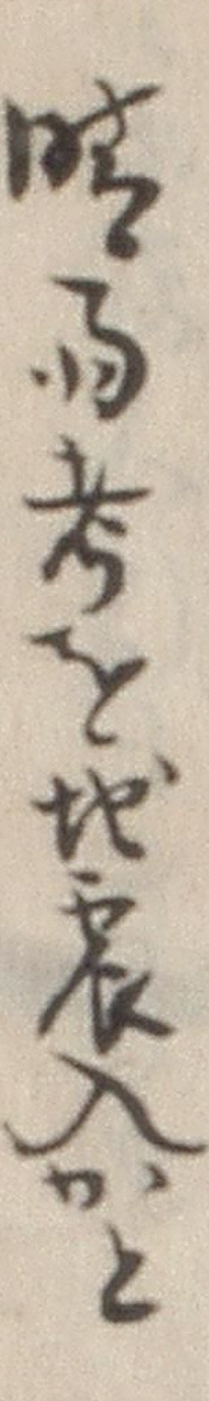晴雨考を地震入かと
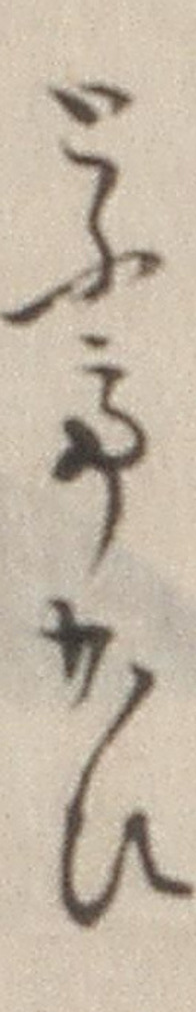いふてかひ
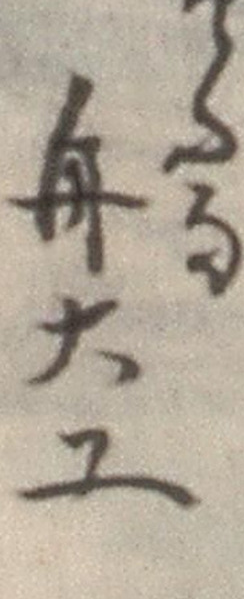舟大工
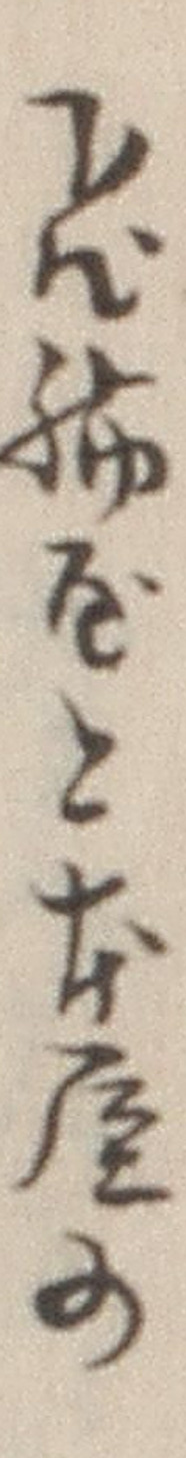飛脚屋と本屋の
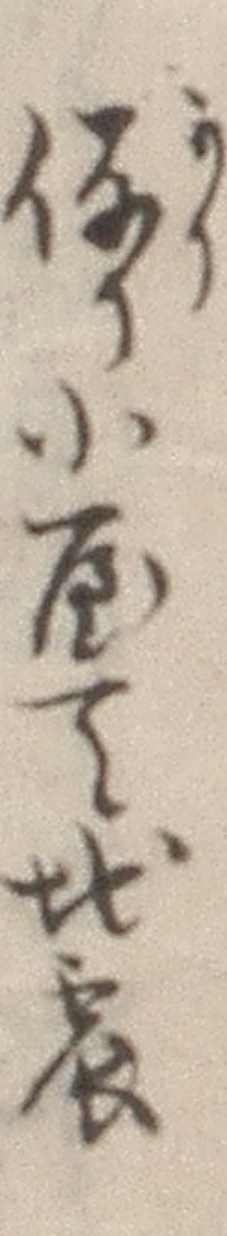仮り小屋て地震
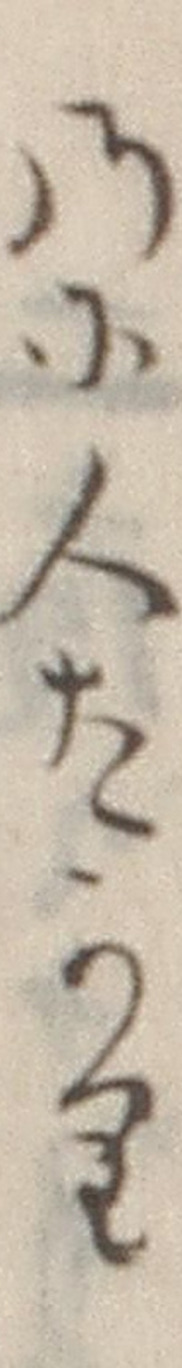門に人たかり
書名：諸國大地震年代記末代噺種
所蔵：東京大学地震研究所図書室 Earthquake Research Institute Library, The University of Tokyo, JAPAN
